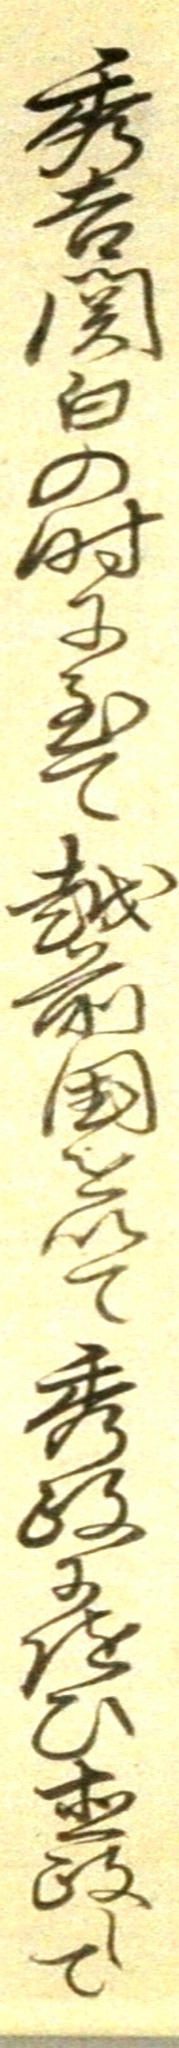秀吉関白の時に至て越前国を以て秀政に随ひ直政して

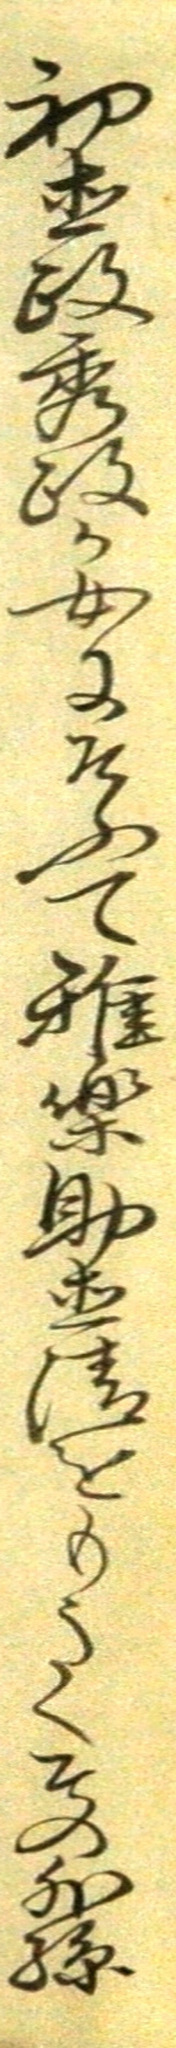初直政秀政か女にそふて雅楽助直清をもうくその外孫
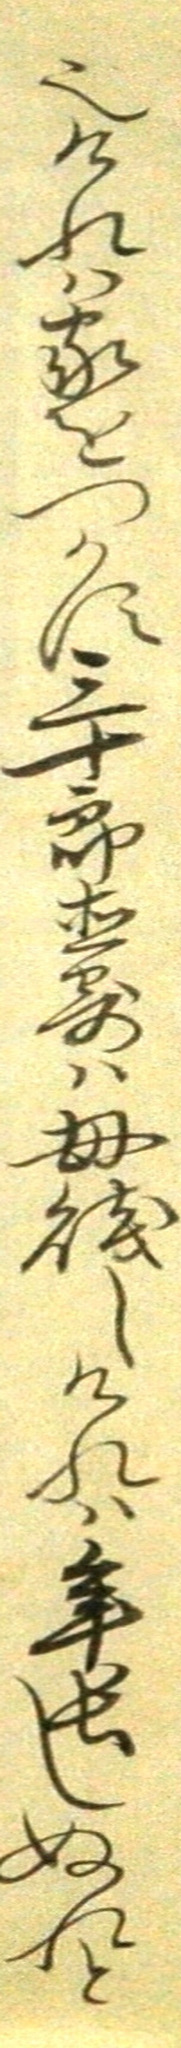也けれは家をつかす三十郎直寄は母賤しけれは年長しぬれと
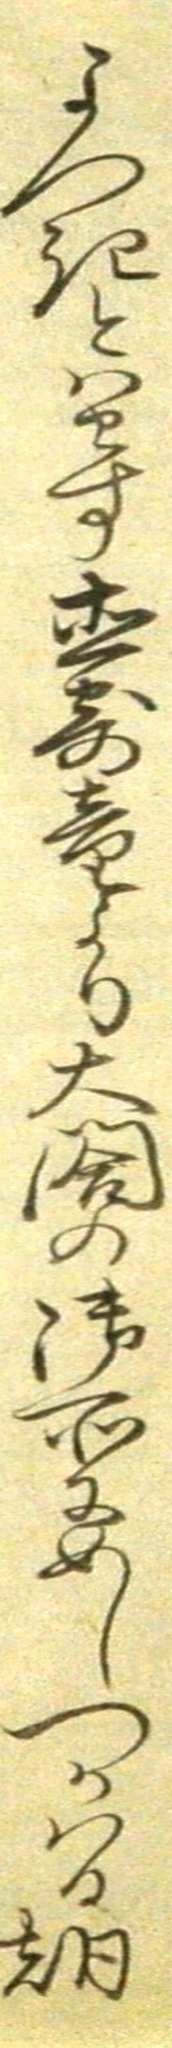よつきとはせす直寄童より太閤の御所にめしかはる朝
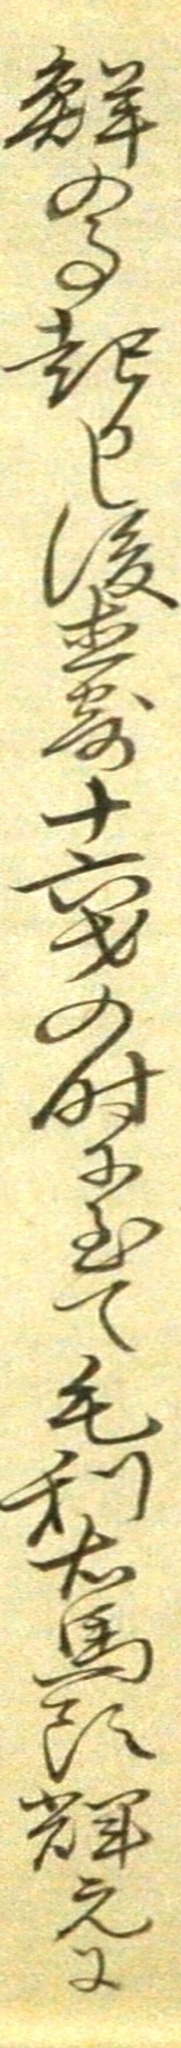鮮の事起りし後直寄十六才の時に至て毛利右馬頭輝元に
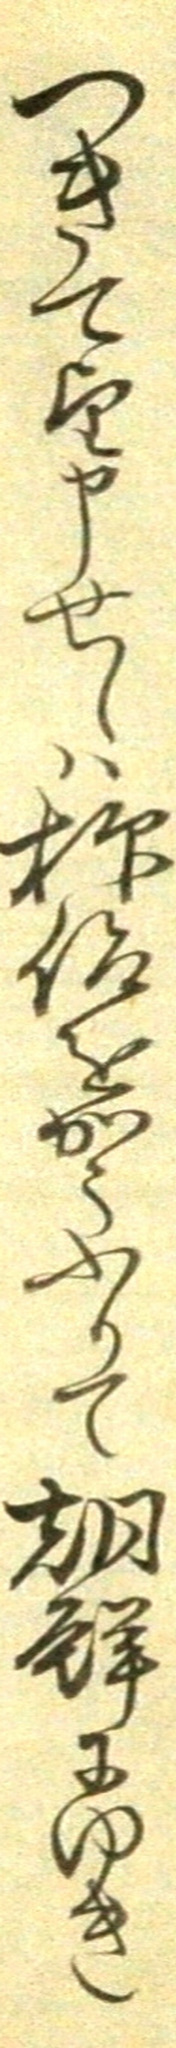つきて望申せしは抑仰をかうふりて朝鮮にゆき
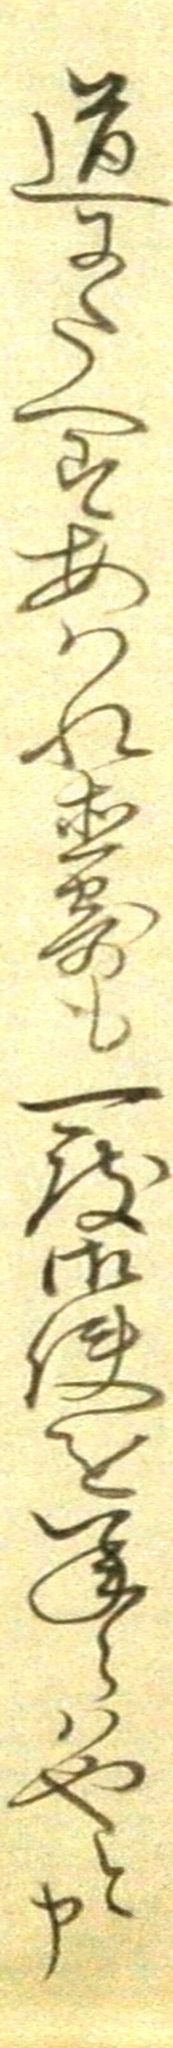道にたへすあはれ直寄も一度御使を承らはやと申
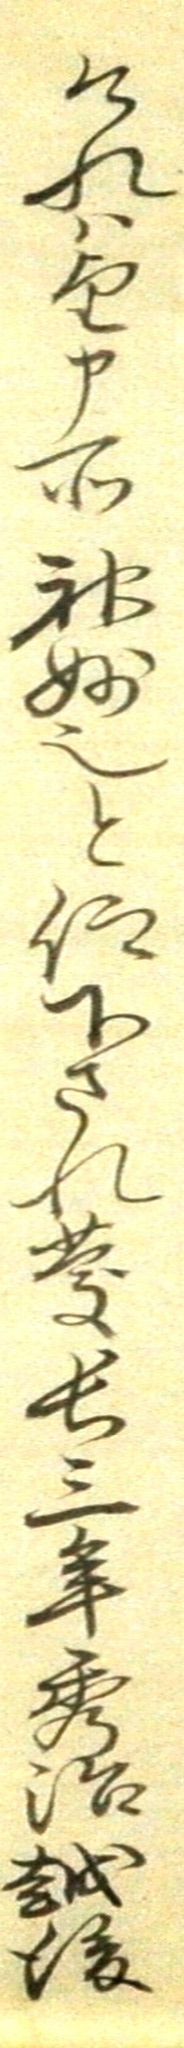けれは望申所神妙也と仰下され慶長三年秀治越後
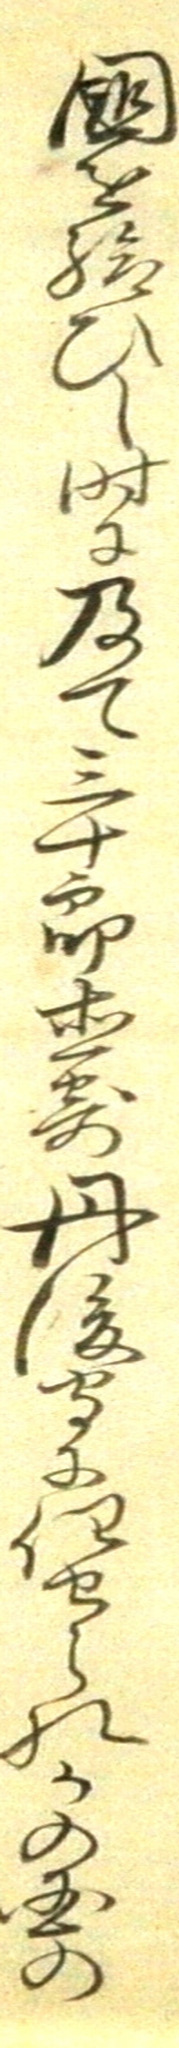国を給ひし時に及て三十郎直寄丹後守に任せられかの国の
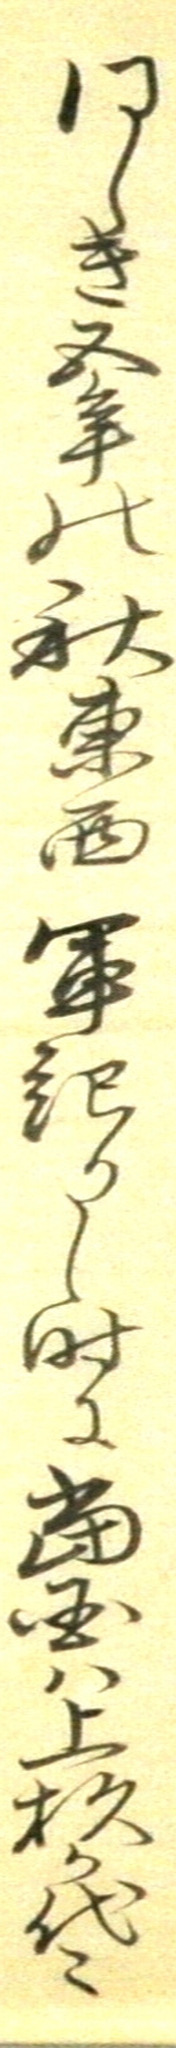同しき五年の秋東西軍起りし時に当国は上杉か代々
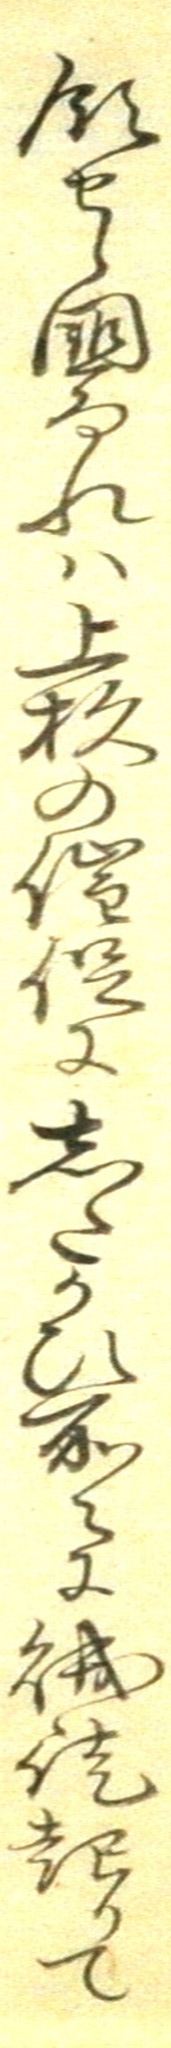領せし国なれは上杉の催促にしたかひ所々に賊徒起りて
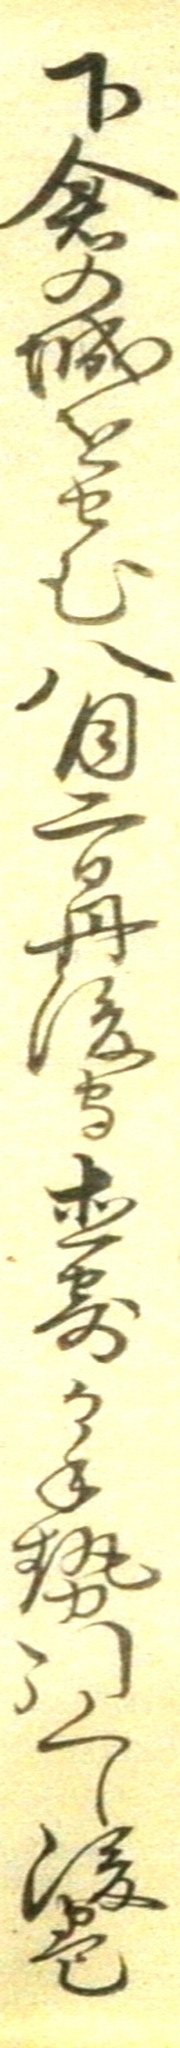下倉の城をせむ八月二日丹後守直寄か手勢引くし後巻
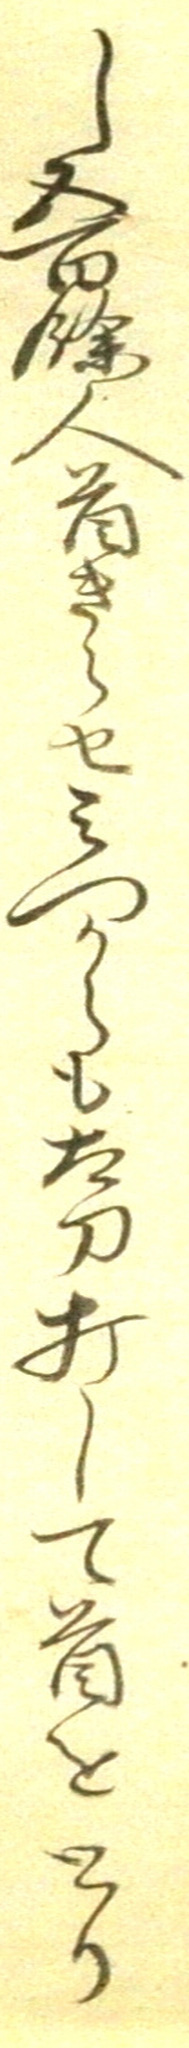し五百余人首きらせみつからも太刀打して首をとり
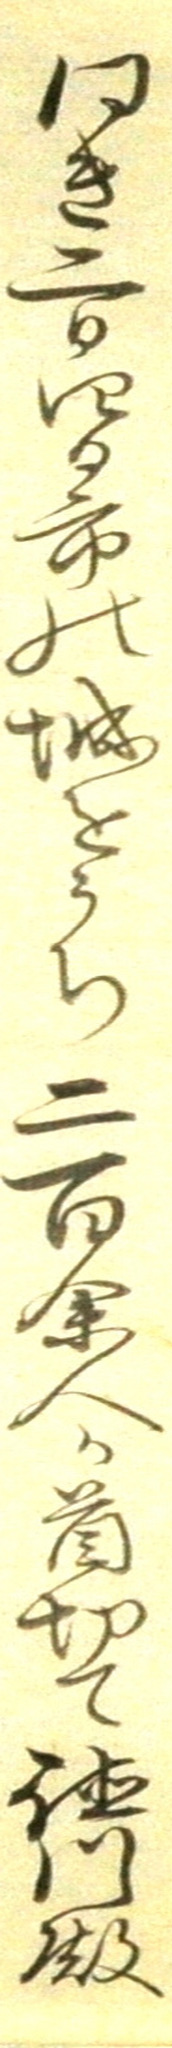同き二日四日市の城をうち二百余人か首切て徳川殿
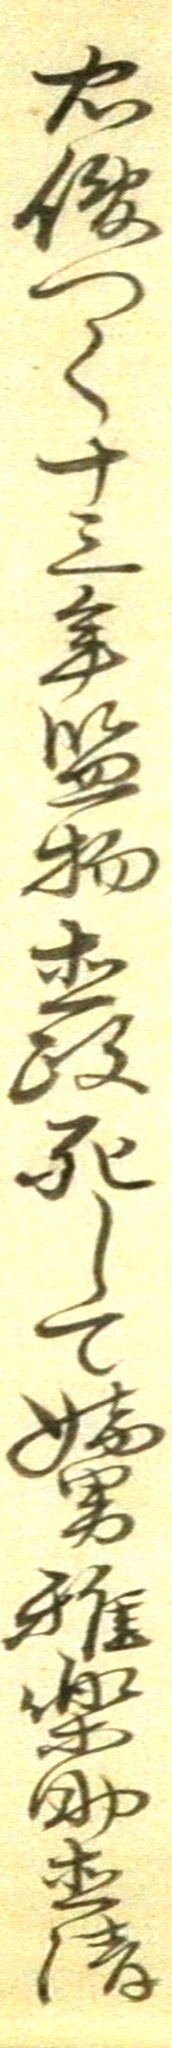忠俊つく十三年監物直政死して嫡男雅楽助直清
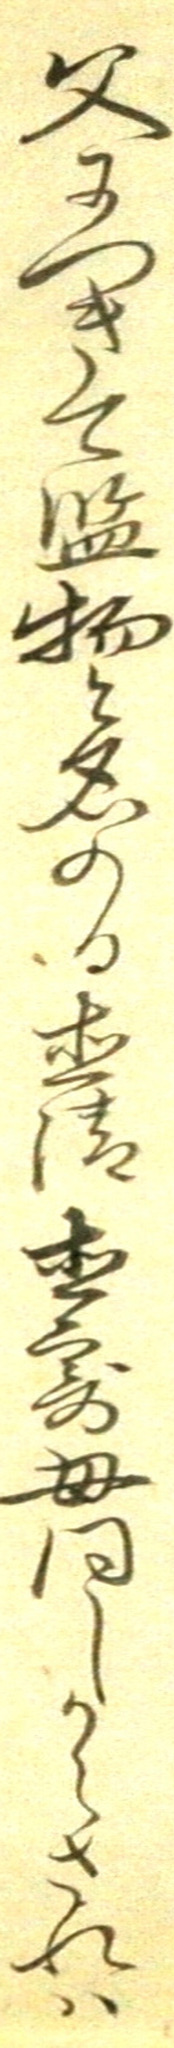父につきて監物と名のる直清直寄母同しからされは
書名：藩翰譜（七・上）
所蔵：伊那市立高遠町図書館・合同会社AMANE
